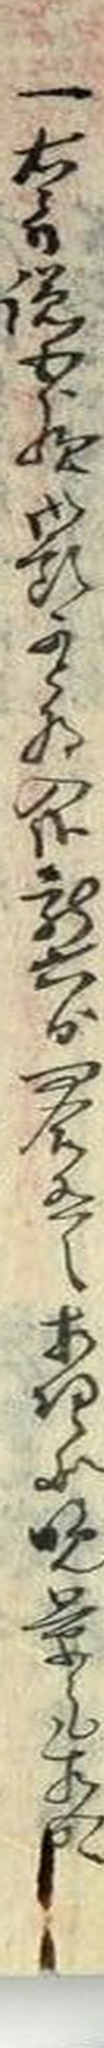一右ニ付謙五郎様御歓可被為入哉新六ゟ問合有之相伺候処晩景ニも相成候
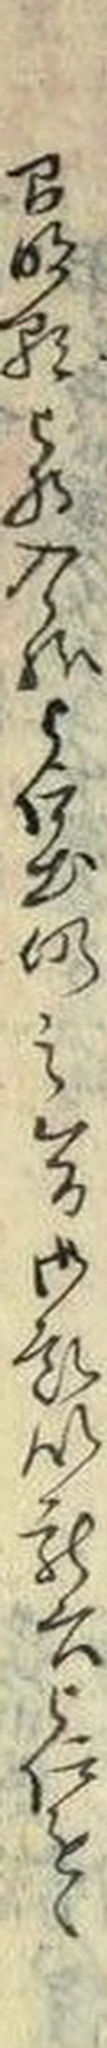間明朝被為入候様被仰出依之今日御歓以新六被仰進候
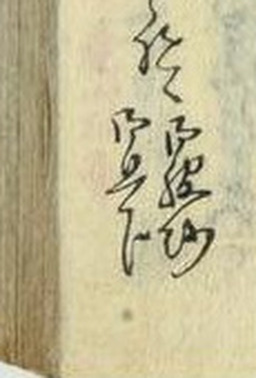御上下

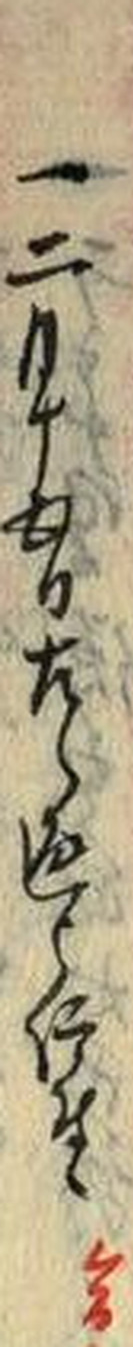一二月十九日左之通被仰付候
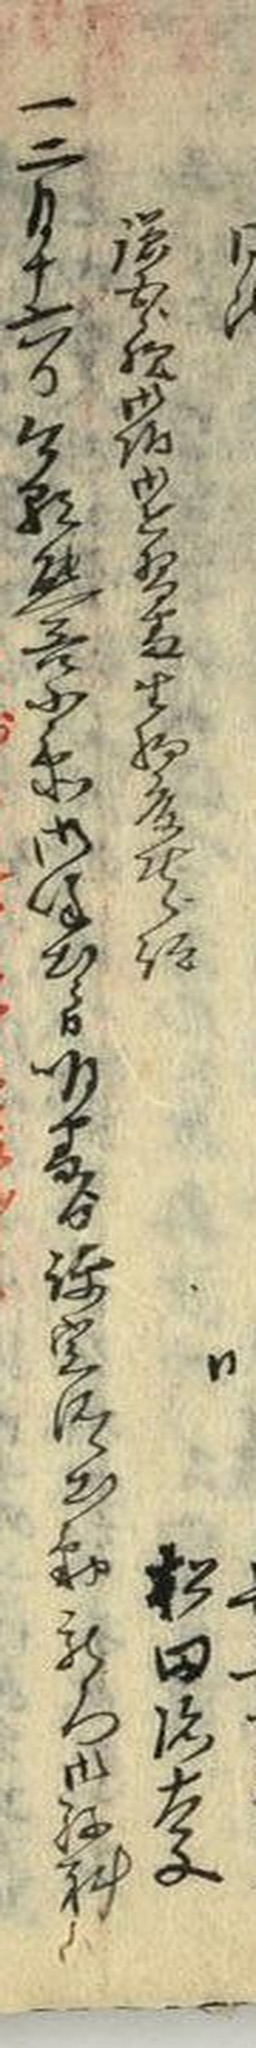一二月十六日今朝熊谷小兵衛御呼出ニ而明番ゟ評定所へ出勤新右衛門御役料
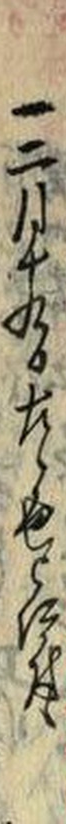一二月十九日左之通被仰付候
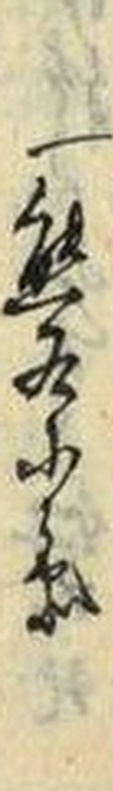熊谷小兵衛
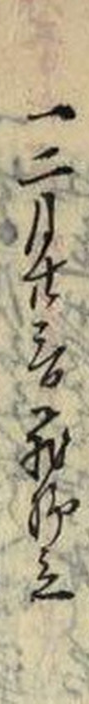一二月廿三日飛脚立
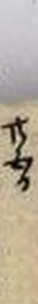廿五日
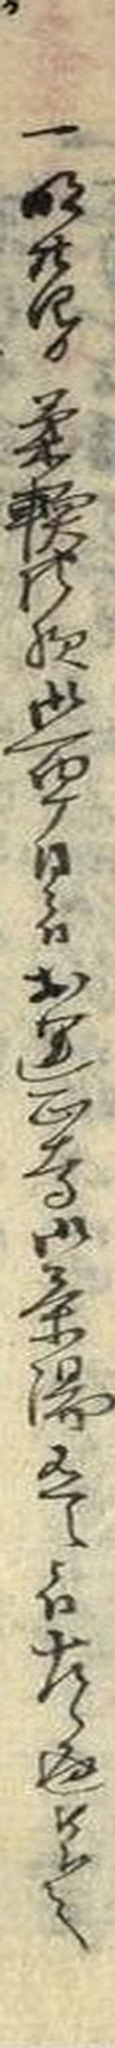一明廿四日柔輭院様御百ケ日ニ付於運正寺御茶湯有之ニ付左之通被下之
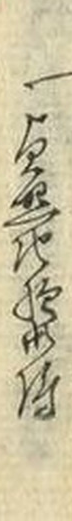貞照院様御附
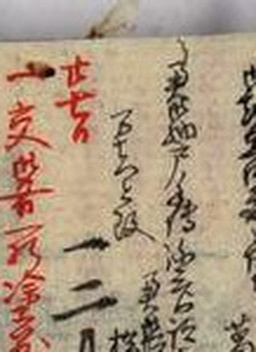万吉と改
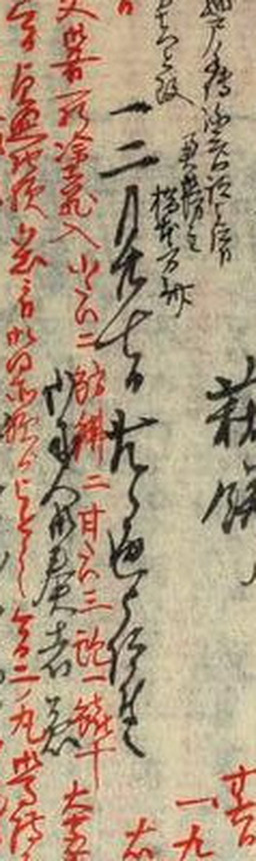一二月廿七日左之通被仰付候
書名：少傅日録抄（斉承付側向頭取日記、在国）
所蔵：福井県文書館 Fukui Prefectural Archives
